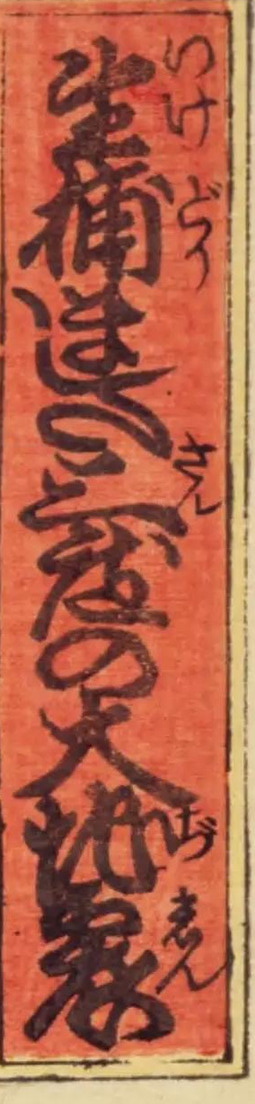生捕ました三度の大地震
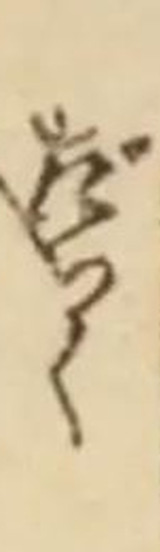だいく
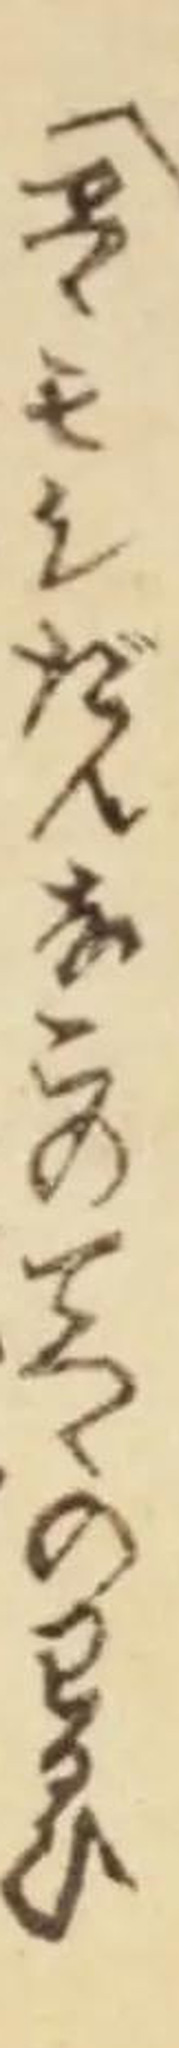「ヱヽモシだんなこのてのわるひ
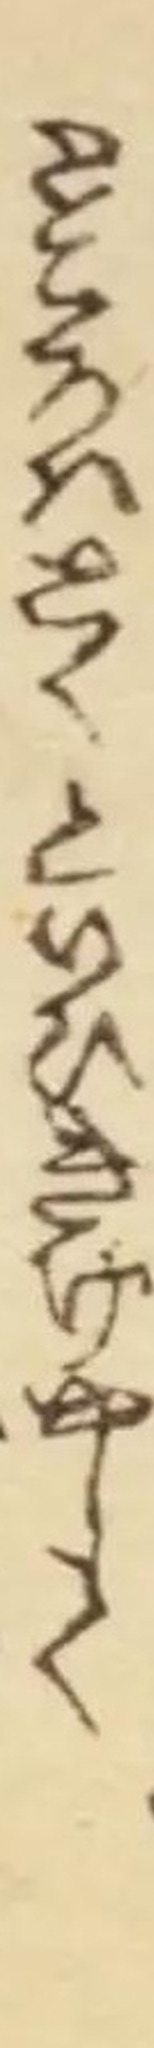ところはとくといひきけやして
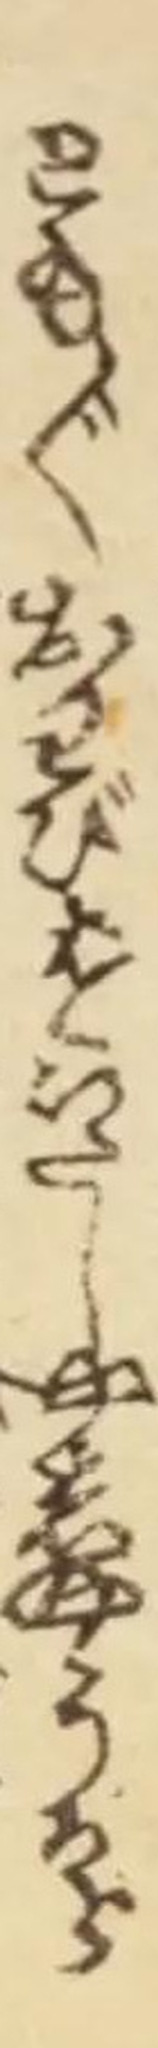とも〴〵おわびをいたしやしやうから
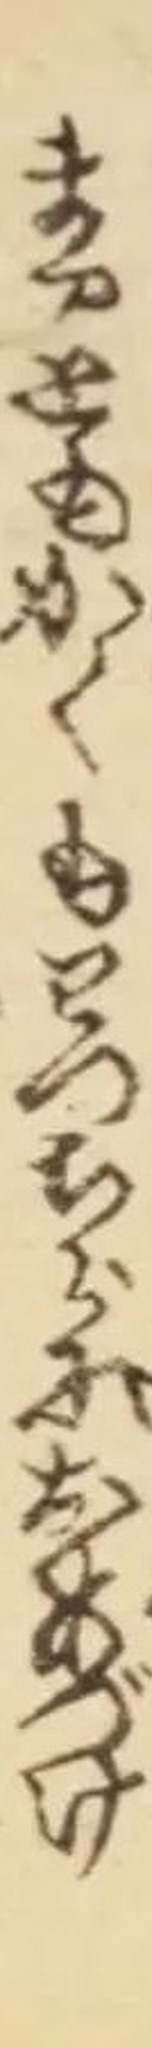まアともかくもわつちらにおあづけ
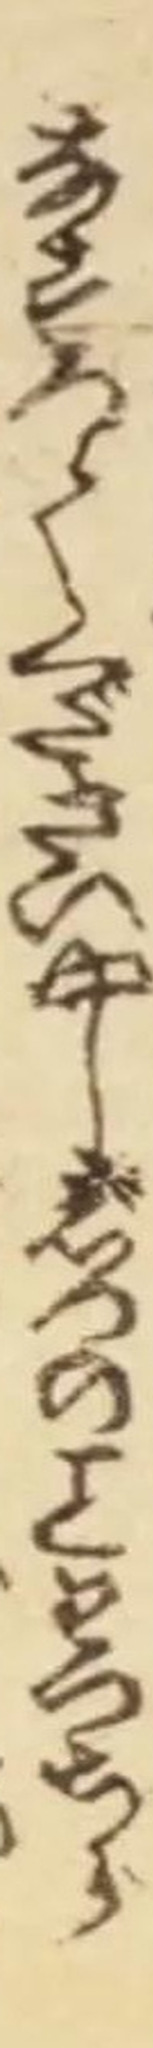なすつてくださいやしじつのことわつちら
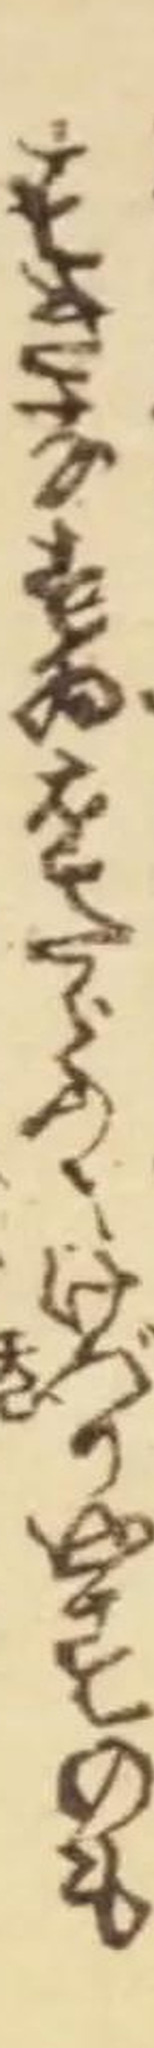すきなをたらふくけづりやすのも
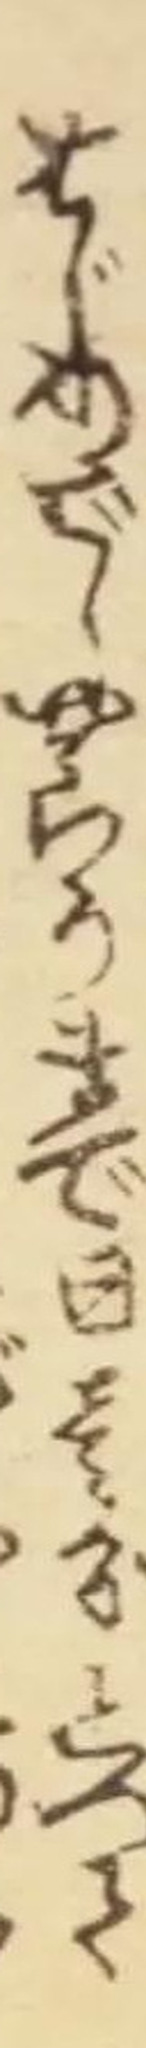はじめでしやらうまで日壱分とつて
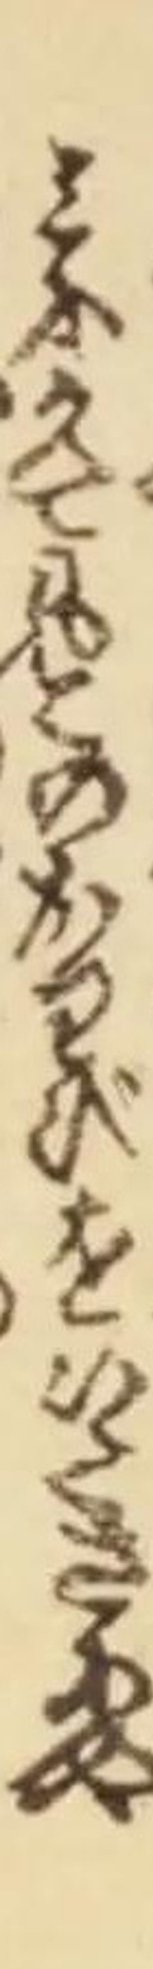みにかへてもこのおわびをいたさにや
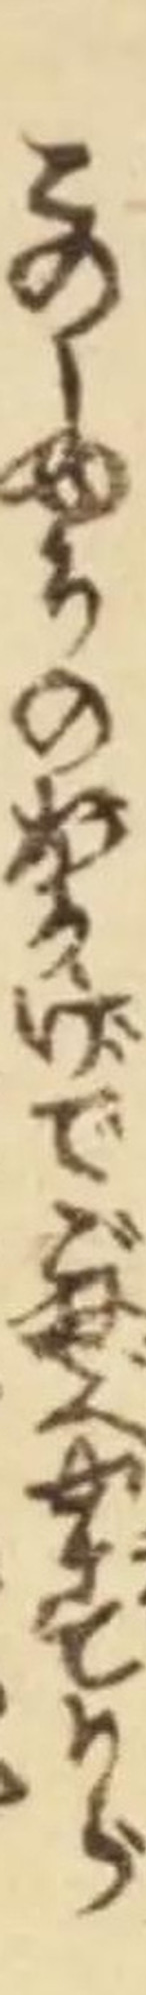このしゆのおかげでごぜへやすから
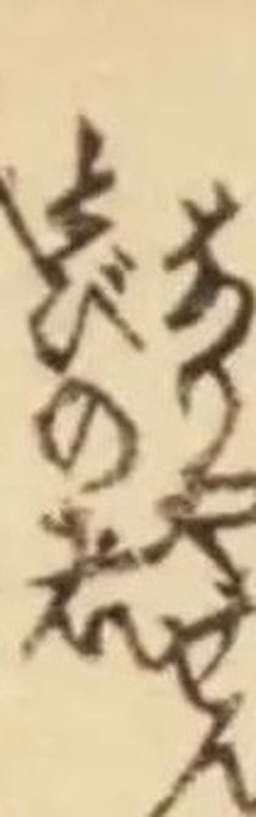とびの者
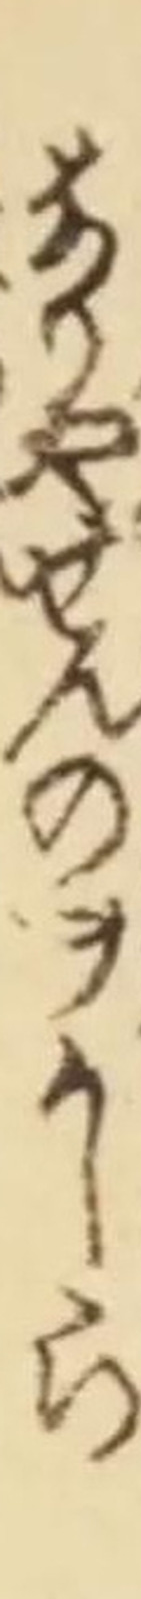なりやせんのヲかしら
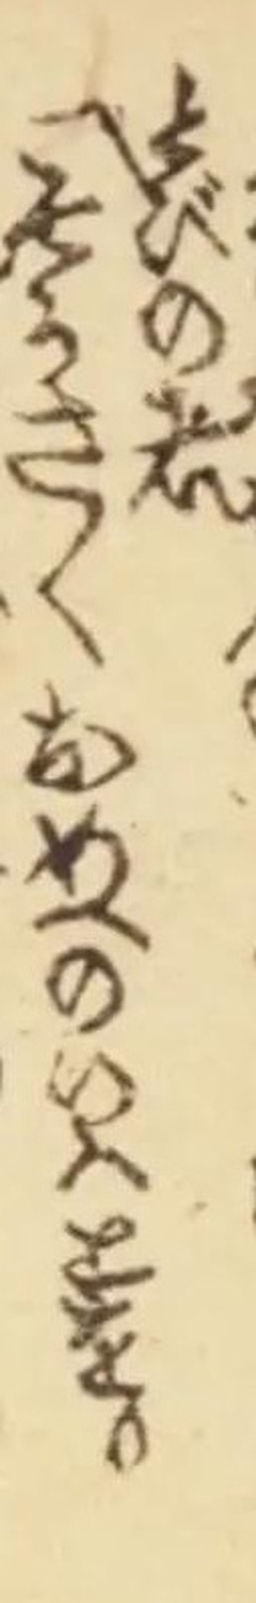「そうさ〳〵おめへのいふとをり
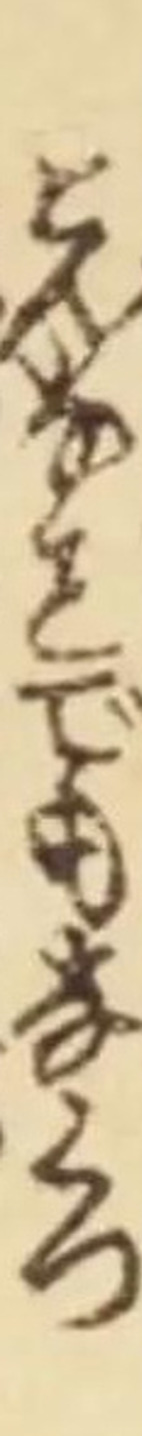こんなことでもなくつ
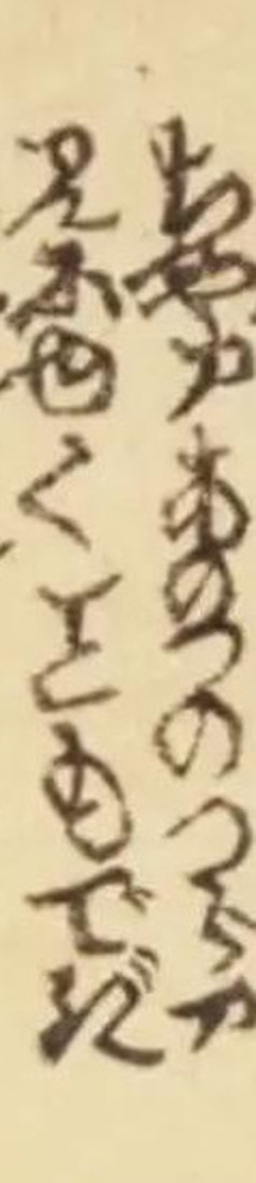見にゆくこともでき
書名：生捕ました三度の大地震
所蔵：国立国会図書館 National Diet Library, JAPAN
